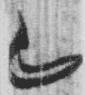㠯（以）
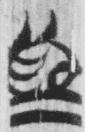爲
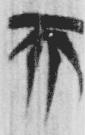天
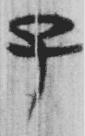子
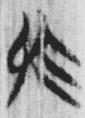於
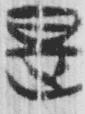是
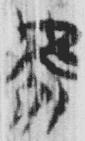{虍介}（乎）
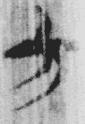方
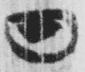囩（圓）
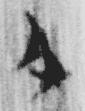千
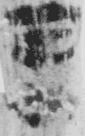里
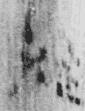於
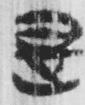是
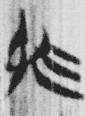於（乎）
